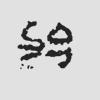於
